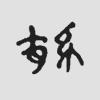{十月糸}
